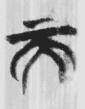而
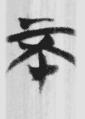不
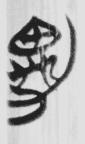{禺力}
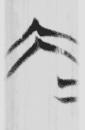大=
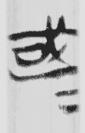或=
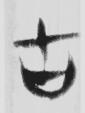古
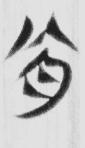{冖肉}
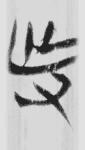拃
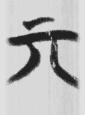亓
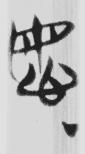悔
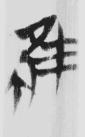蜼
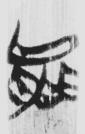能
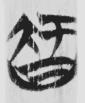智
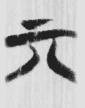亓
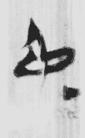身
